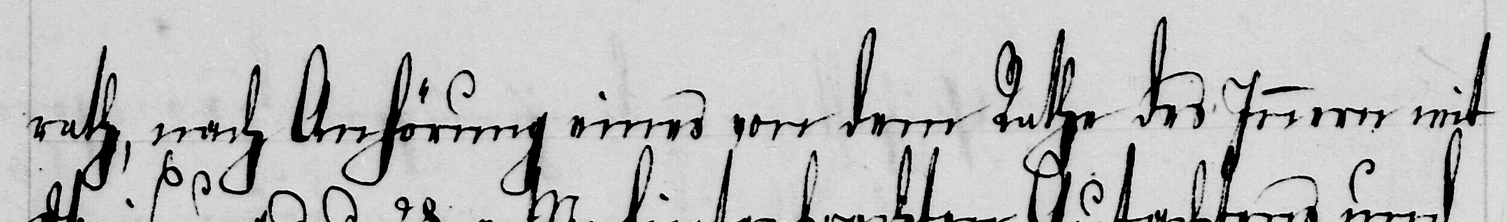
rath, nach Anhörung eines von dem Rathe des Innern mit
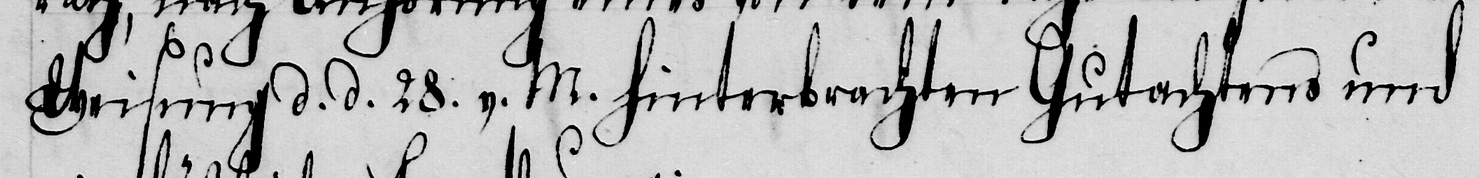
Weisung d. d. 28. v. M. hinterbrachten Gutachtens und
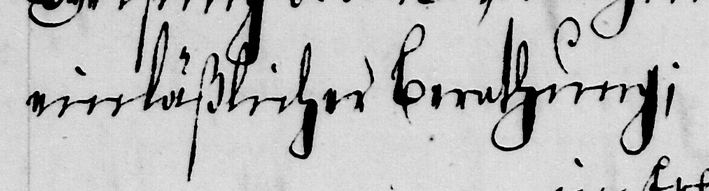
einlässlicher Berathung;
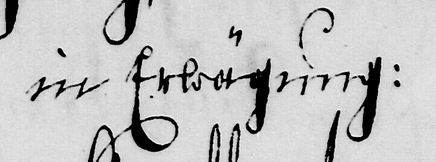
in Erwägung:
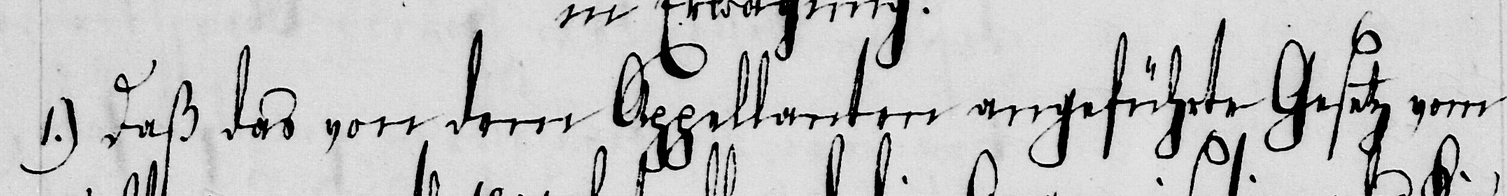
1.) Daß das von dem Appellanten angeführte Gesetz vom
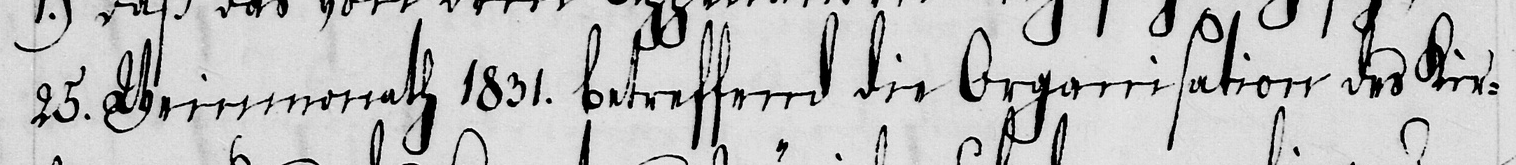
25. Weinmonath 1831. betreffend die Organisation des Kir¬
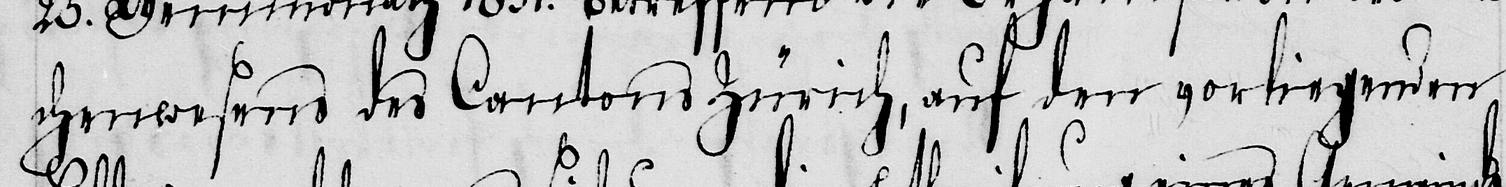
chenwesens des Cantons Zürich, auf den vorliegenden
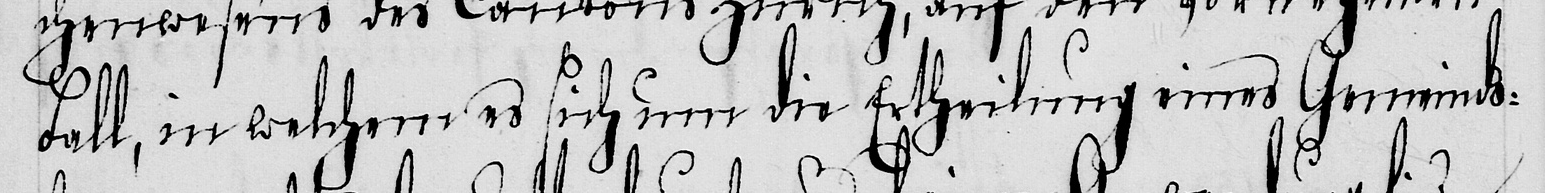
Fall, in welchem es sich um die Ertheilung eines Gemeinds¬
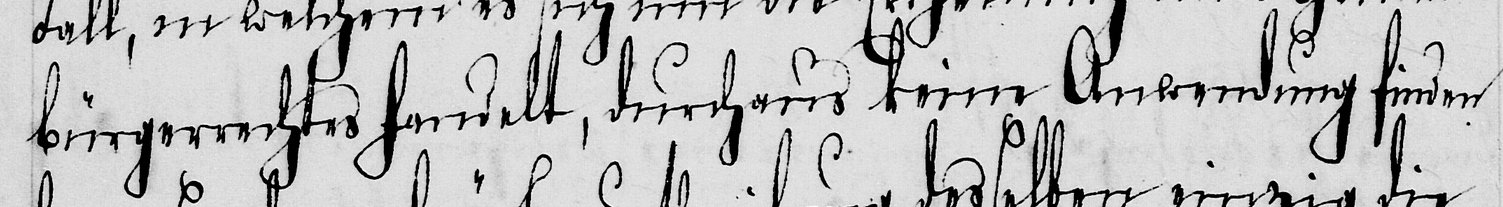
bürgerrechtes handelt, durchaus keine Anwendung finden
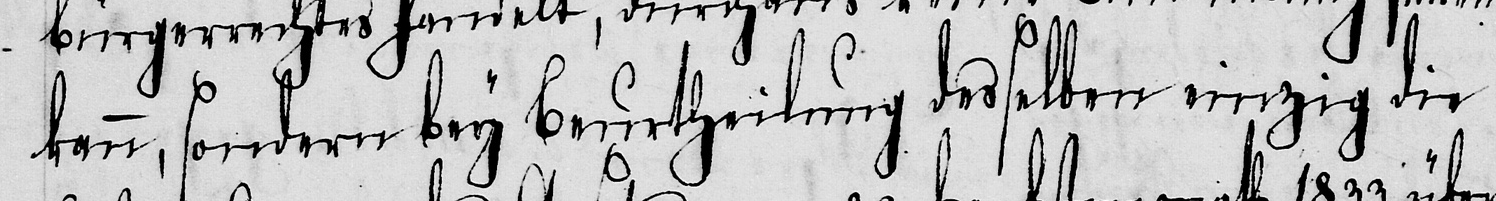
kann, sondern bey Beurtheilung desselben einzig die
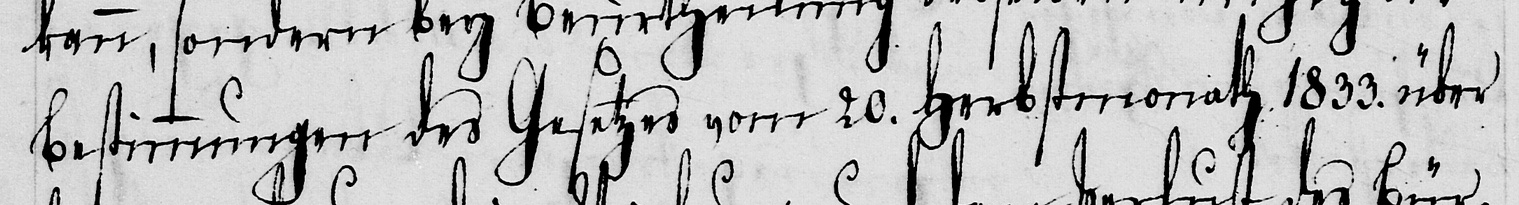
Bestimmungen des Gesetzes vom 20. Herbstmonath 1833. über
